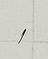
etc.
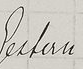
Gestern
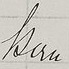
hat
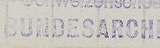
geneigt sei die Subvention
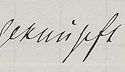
begreiflich
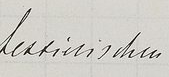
Gestern vernahm
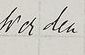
ich Bern
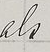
erst
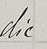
des
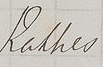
Rathes
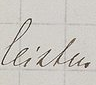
leisten.
